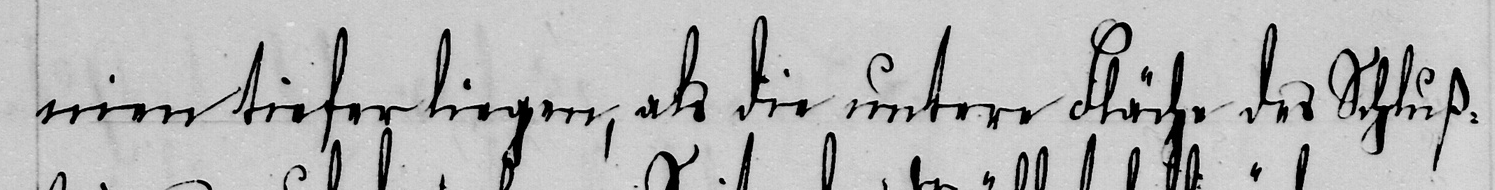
nien tiefer liegen, als die untere Fläche des Schluß¬
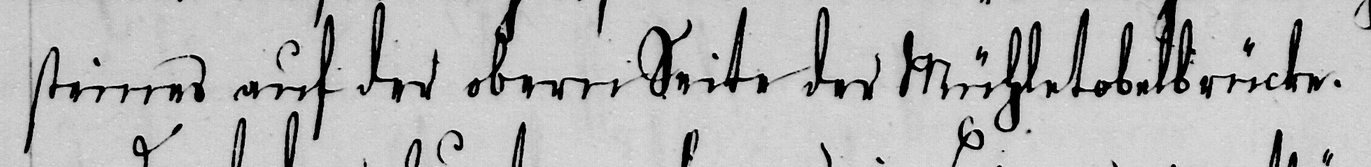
steines auf der obern Seite der Mühletobelbrücke.
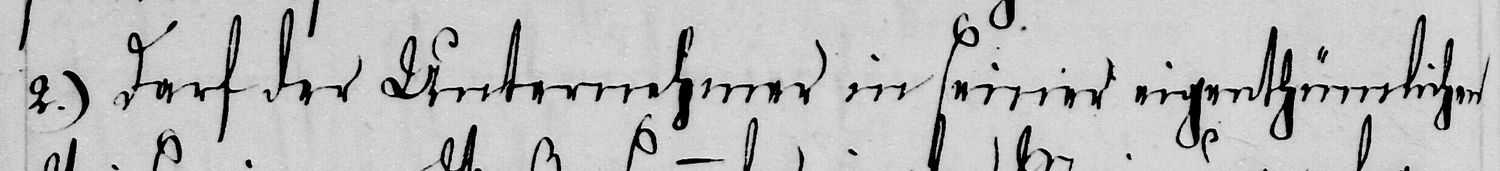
2.) Darf der Unternehmer in seiner eigenthümlichen
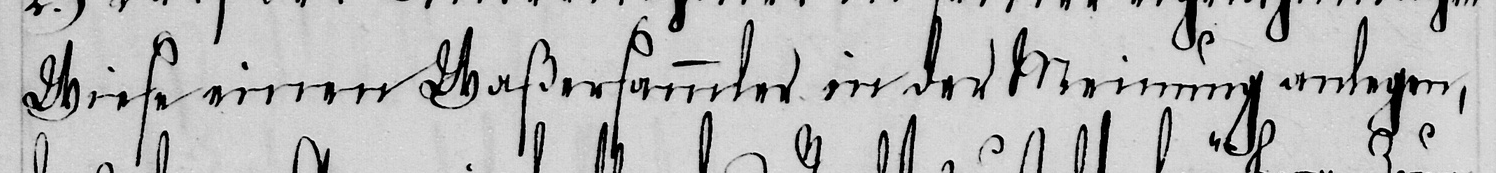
Wiese einen Waßersammler in der Meinung anlegen,
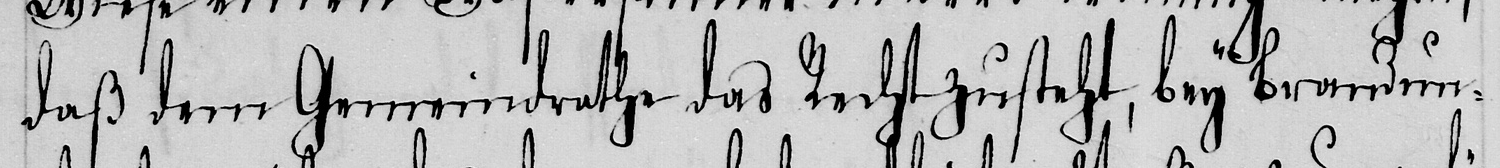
daß dem Gemeindrathe das Recht zusteht, bey Brandun¬
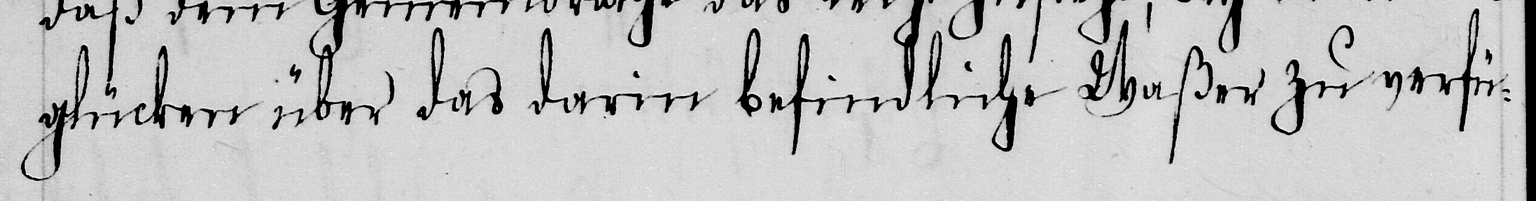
glücken über das darin befindliche Waßer zu verfü¬
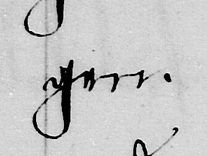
gen.
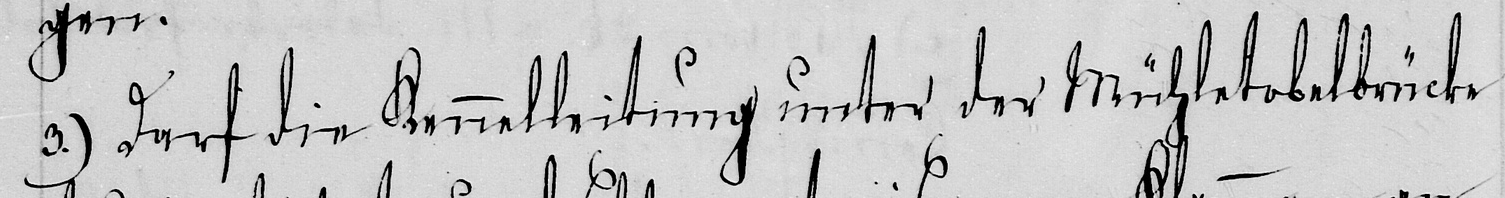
3.) Darf die Kennelleitung unter der Mühletobelbrücke
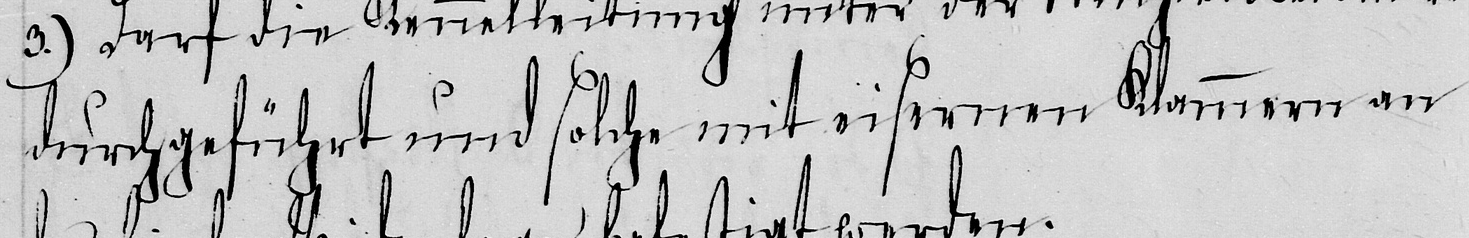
durchgeführt und solche mit eisernen Klammern an
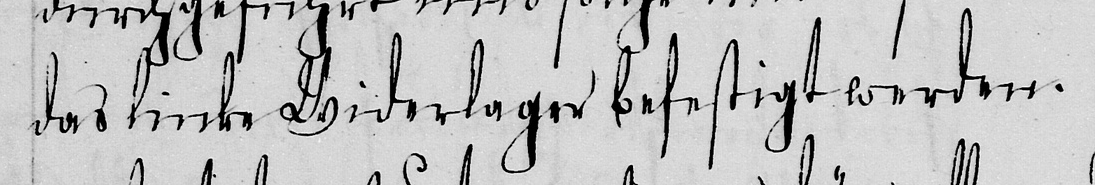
das linke Widerlager befestigt werden.
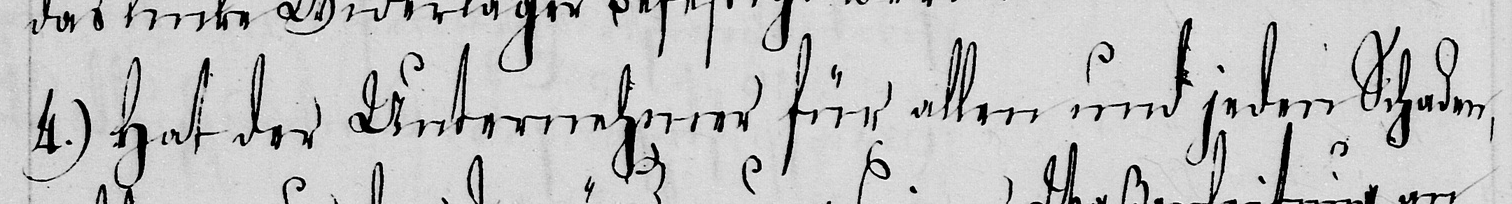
4.) Hat der Unternehmer für allen und jeden Schaden,
